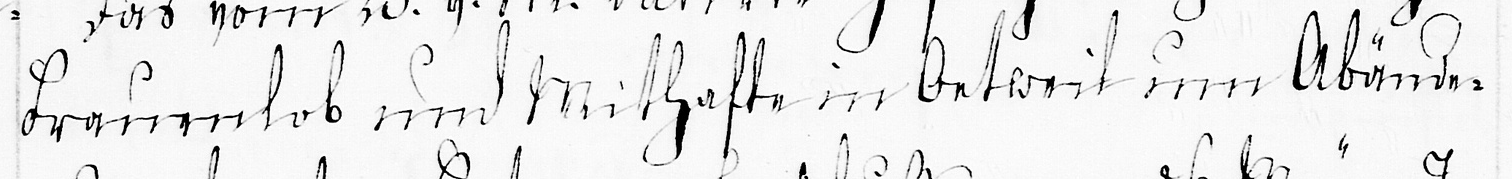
Frauenlob und Mithafte in Oetweil um Abände¬
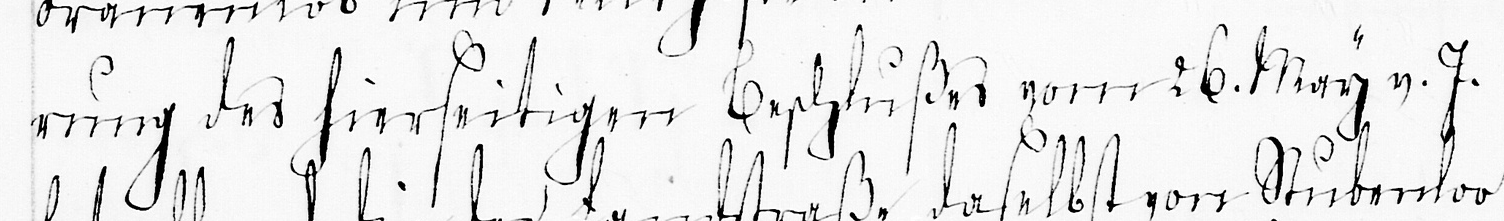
rung des hierseitigen Beschlußes vom 26. März v. J.
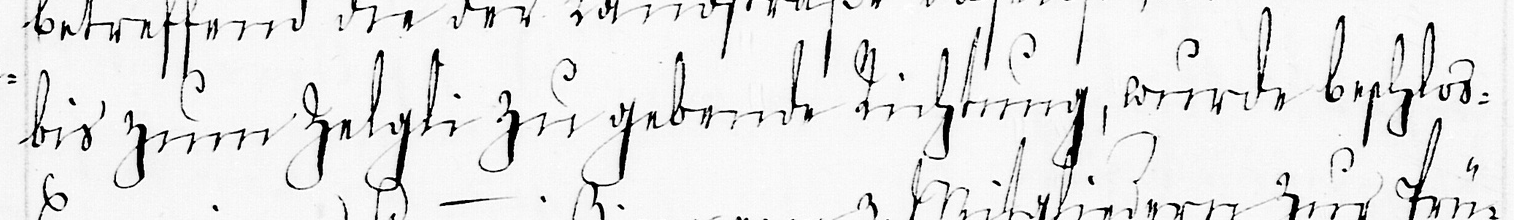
bis zum Zelgli zu gebende Richtung, wurde beschloß¬
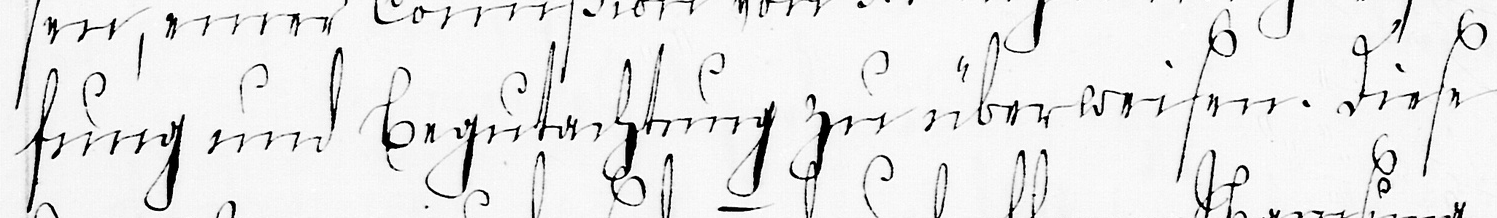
fung und Begutachtung zu überweisen. Diese
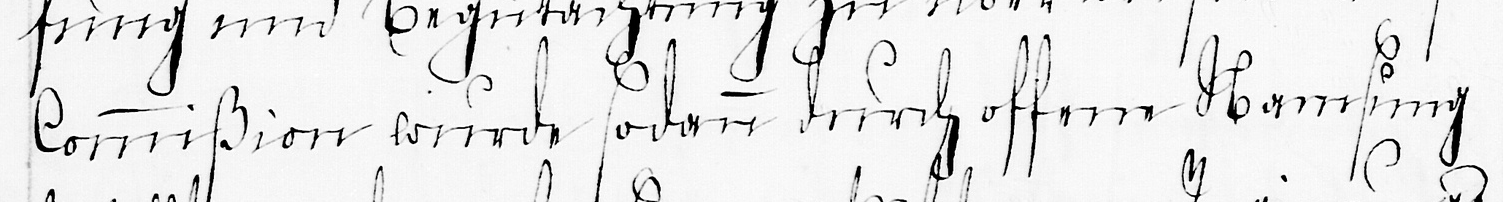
Commißion wurde sodann durch offene Namsung
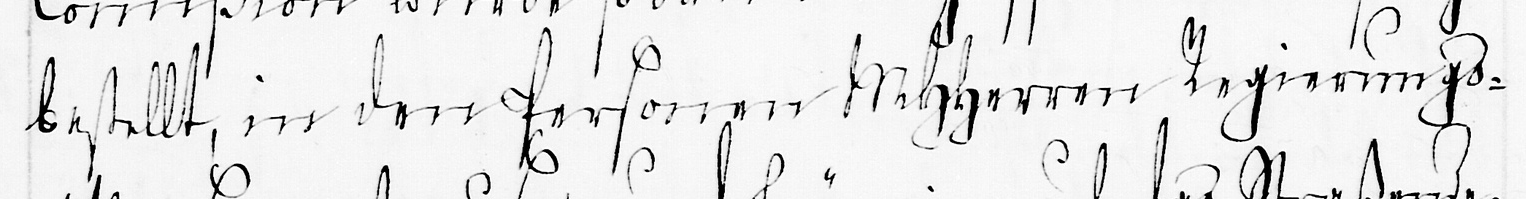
bestellt, in den Personen MHHerren Regierungs¬
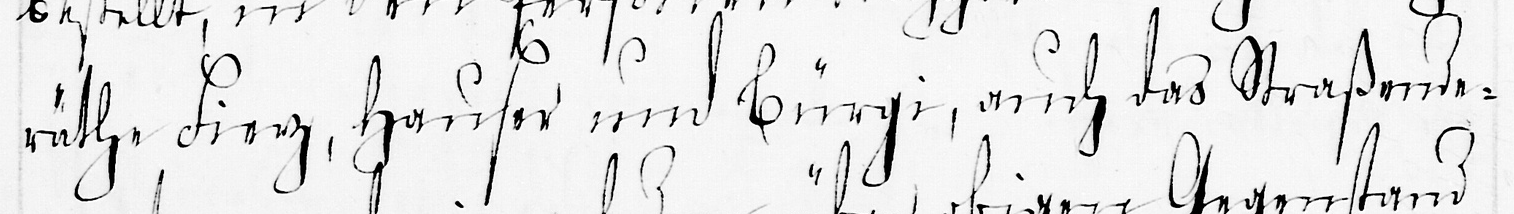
räthe Fiez, Hauser und Bürgi, auch das Straßende¬
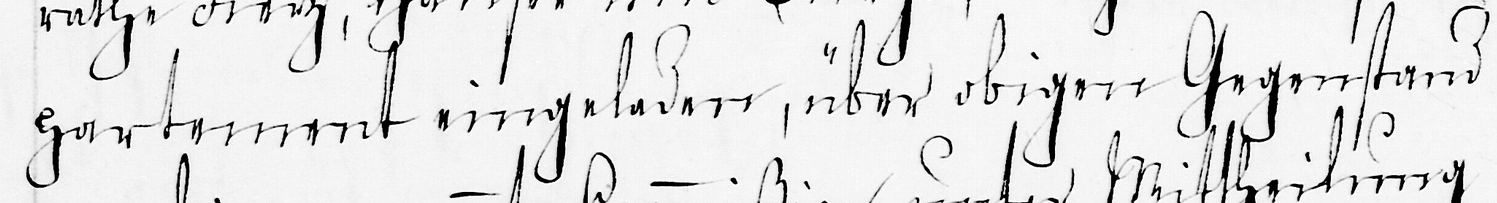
partement eingeladen, über obigen Gegenstand
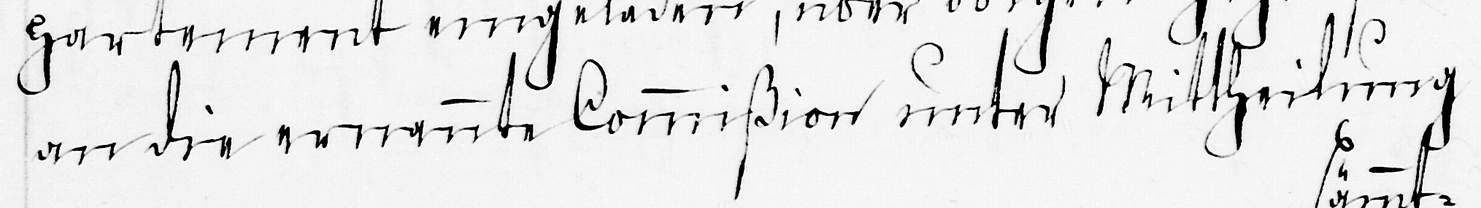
an die ernannte Commißion unter Mittheilung
